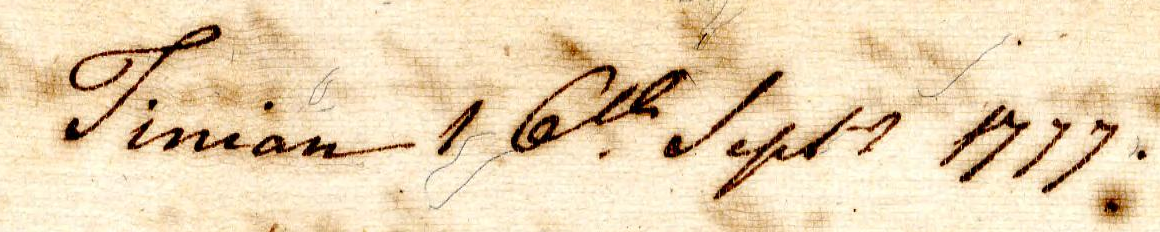Tinian 16^th. Sept^r 1777.
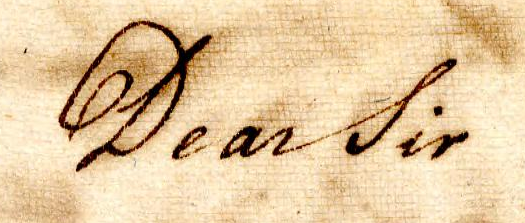Dear Sir
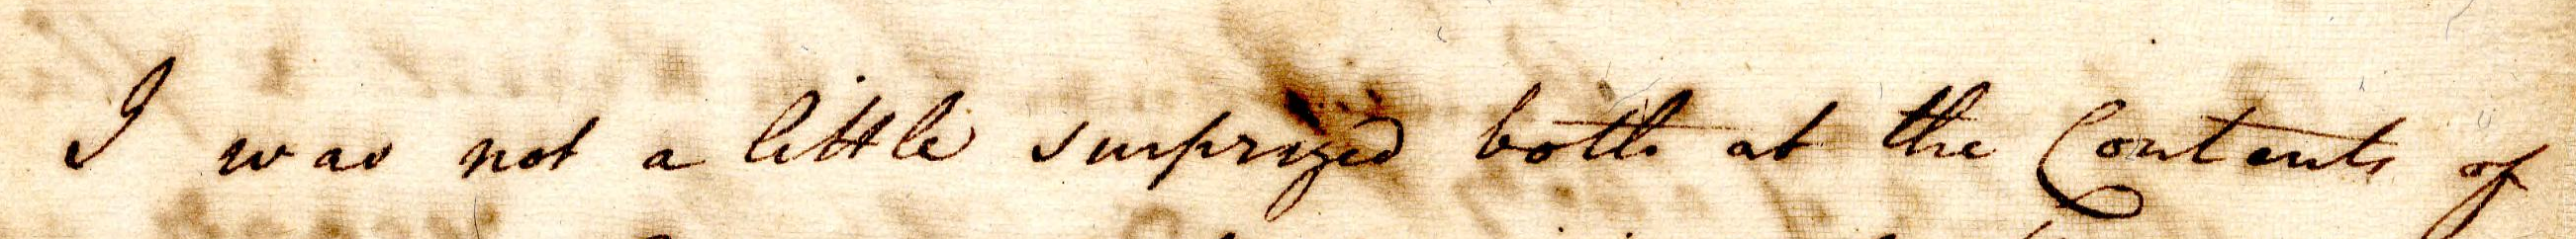I was not a little surprized both at the Contents of
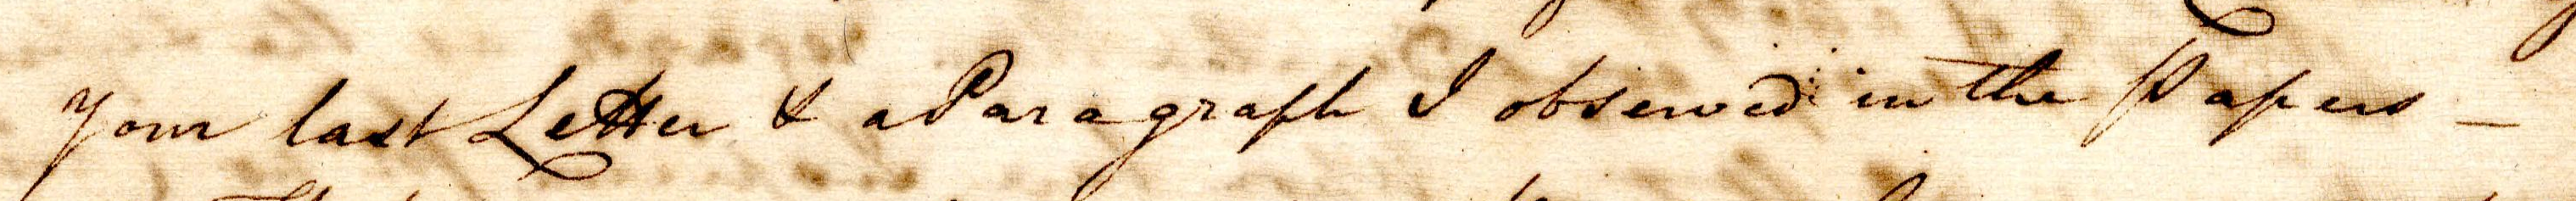your last Letter & a Paragraph I observed in the papers-
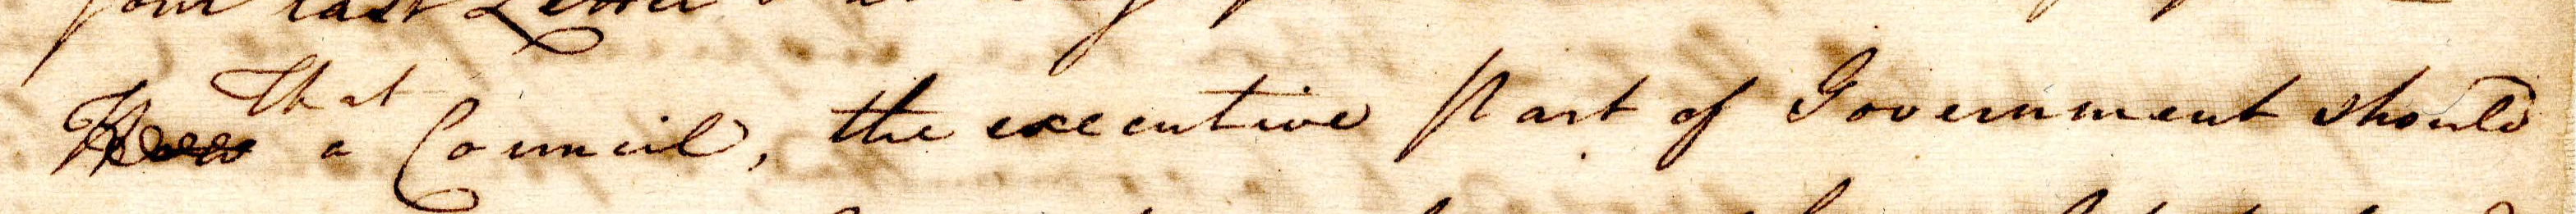Here ^ a Council, the executive part of Government should
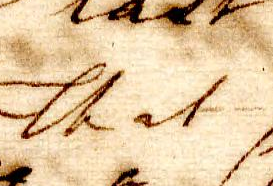that
